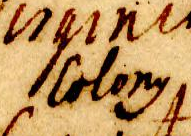Colony
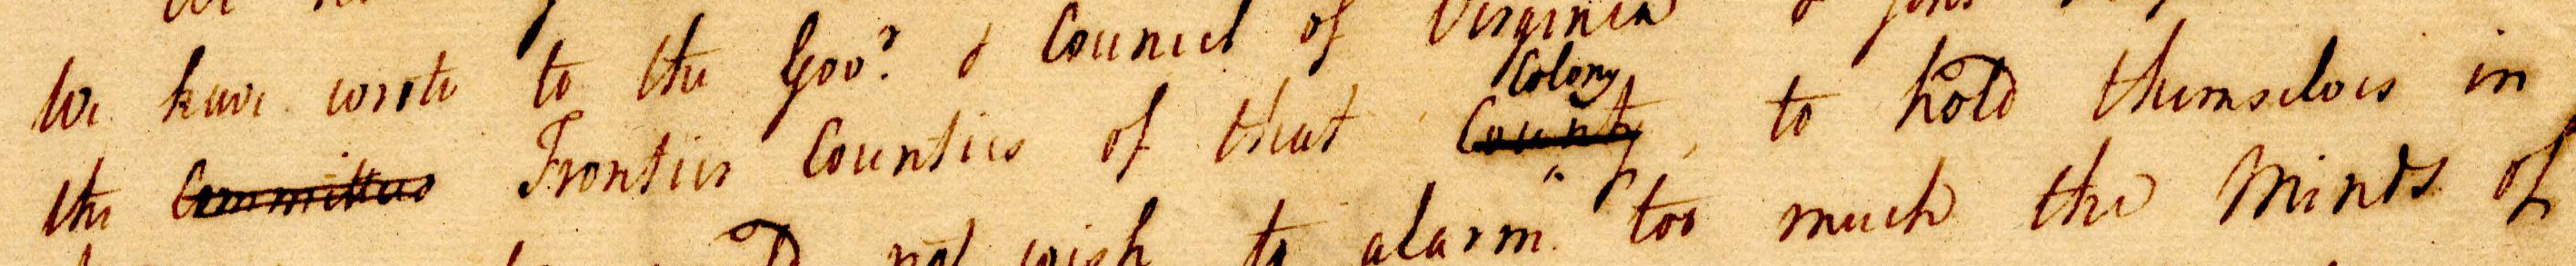the [Committees] Frontier Counties of that [County] ^ to hold themselves in
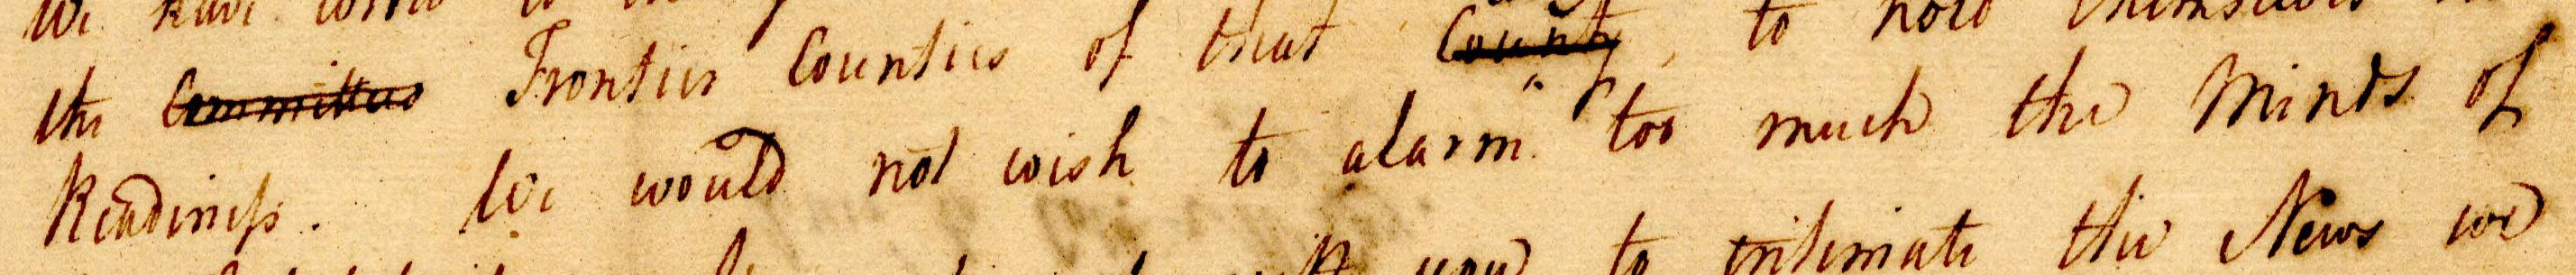Readiness. We would not wish to alarm too much the minds of
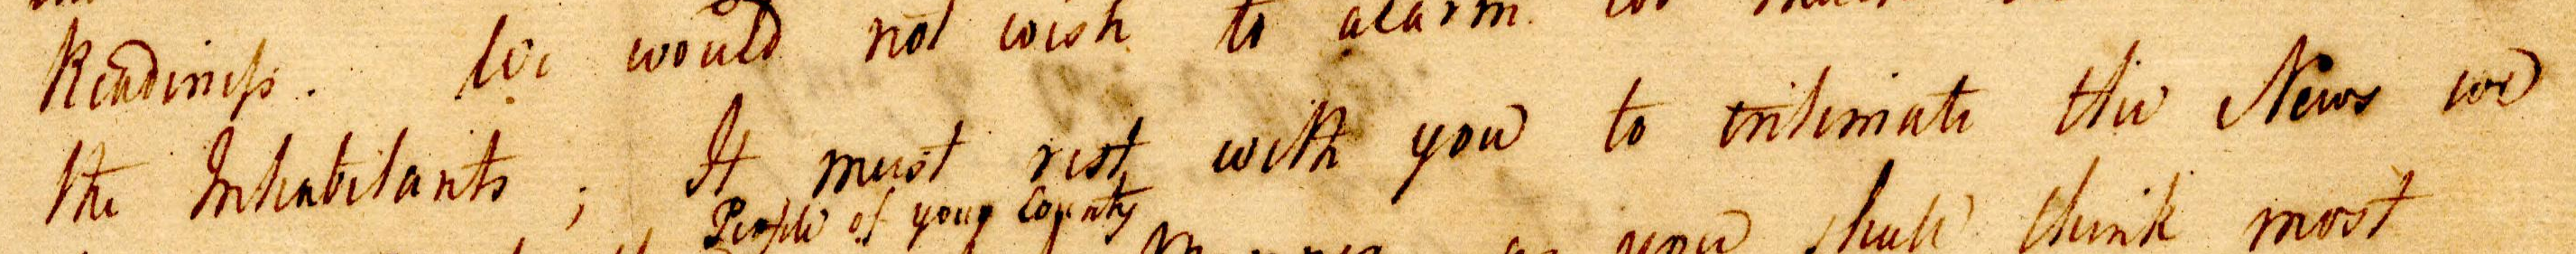the Inhabitants; It must rest with you to intimate the News we
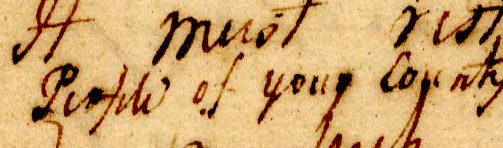People of your County
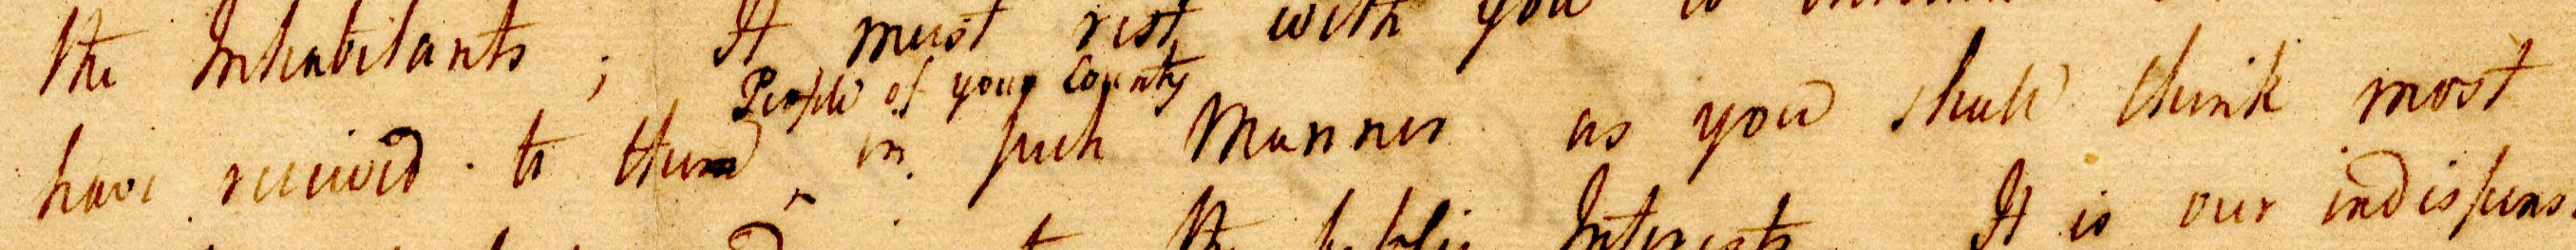have received to them ^ in such Manner as you shall think most
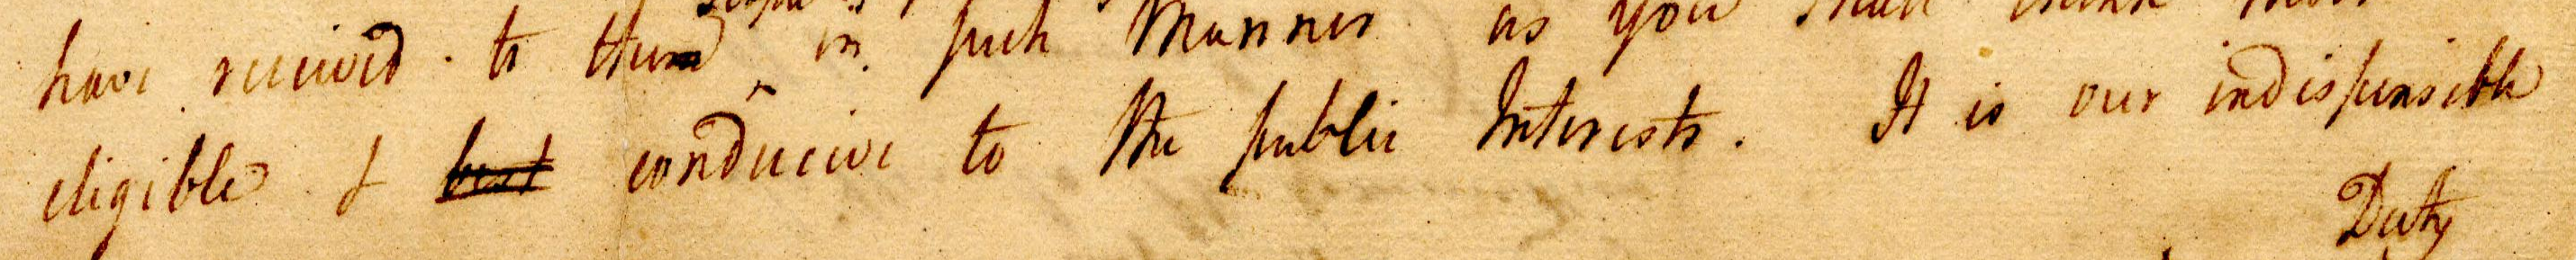eligible & [best] conducive to the public Interests. It is our indispensible
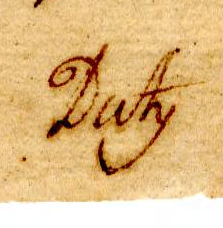Duty
